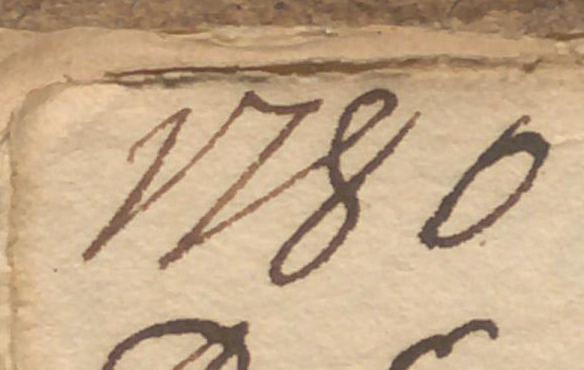1780
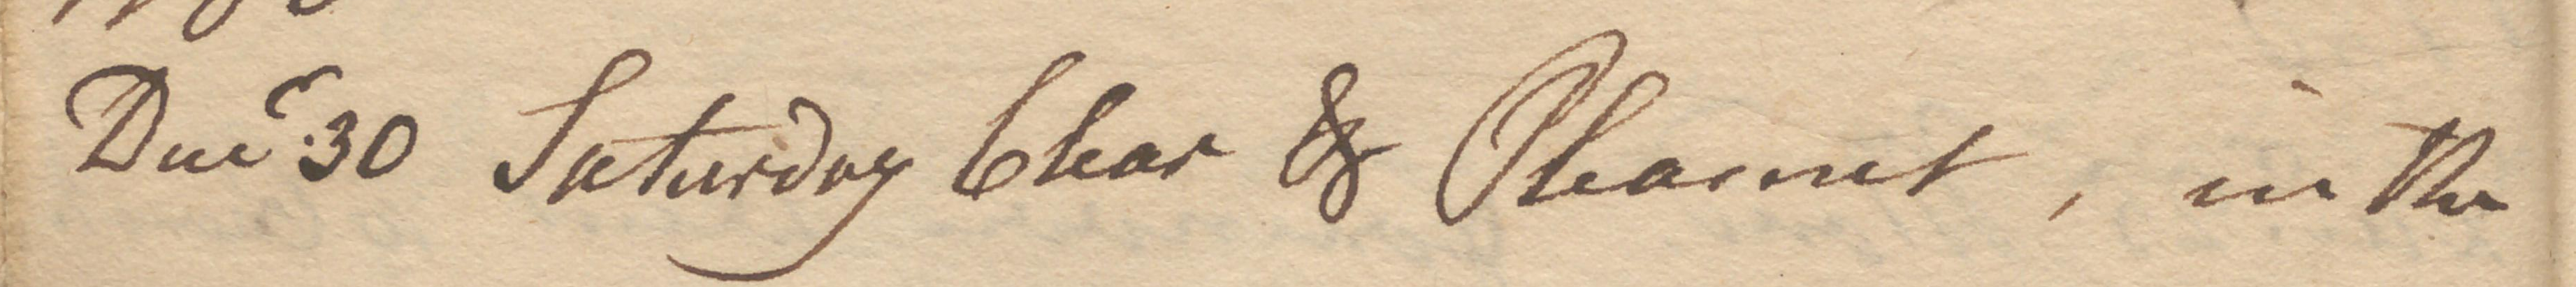Dece^r. 30 Saturday Clear & Pleasent, in the
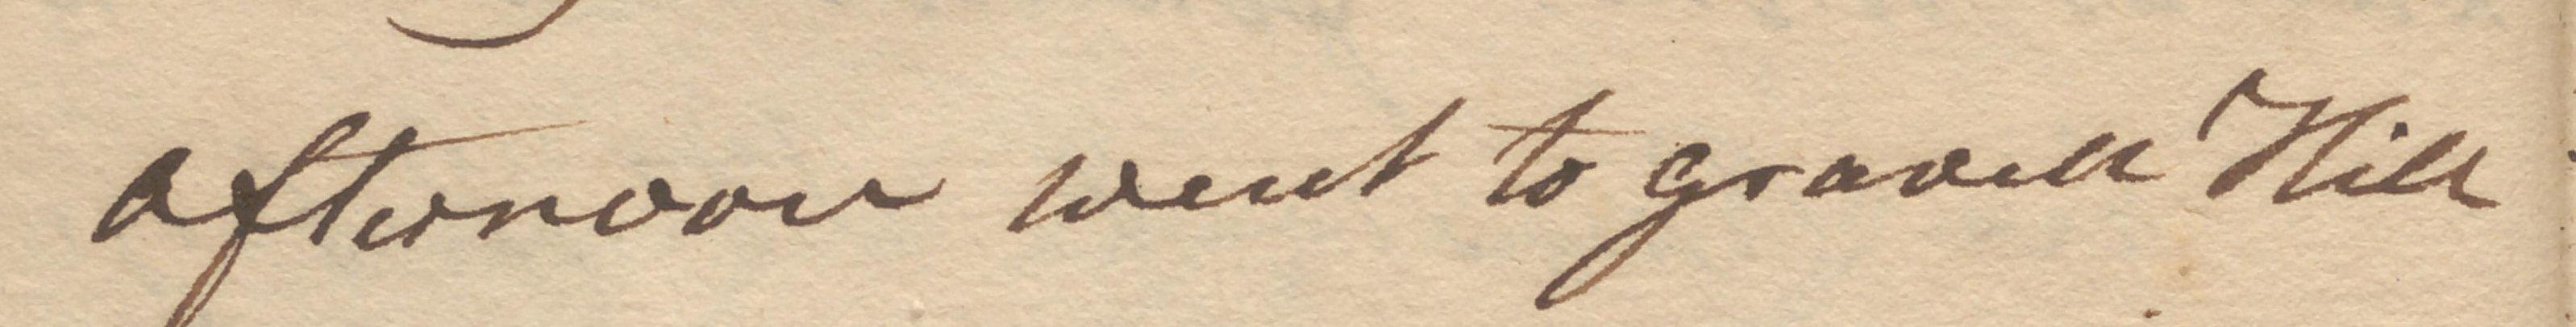afternoon went to gravell Hill
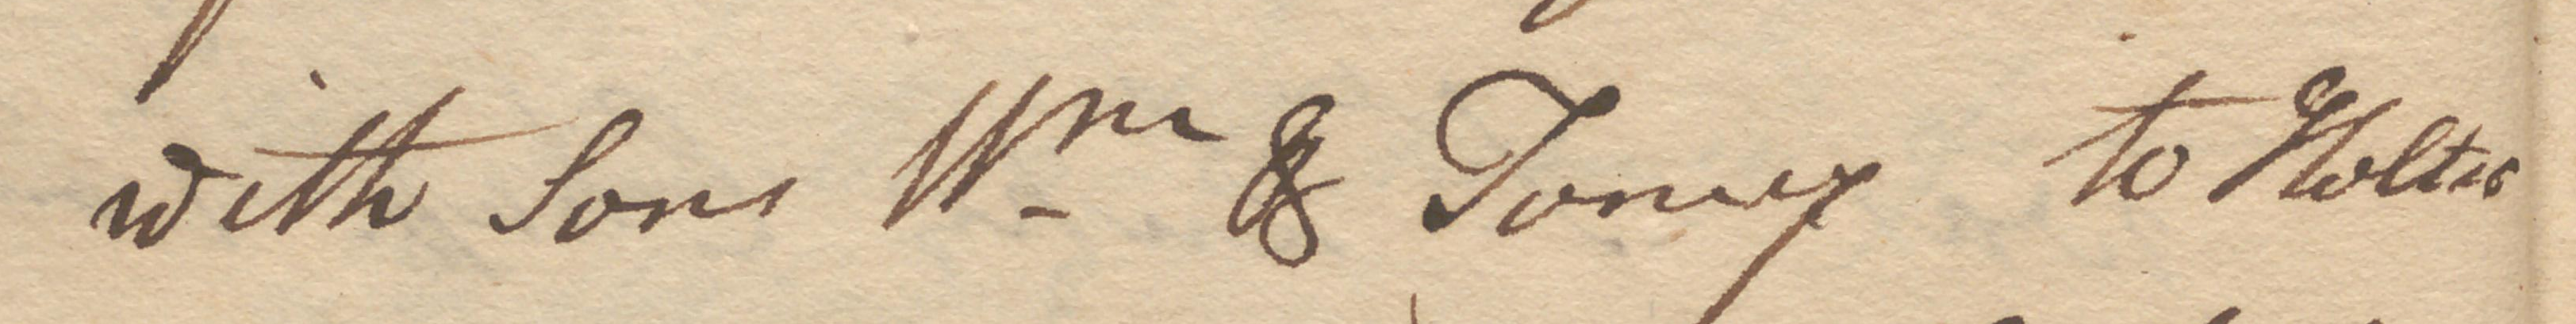with sons W^m. & Tomey to Holter
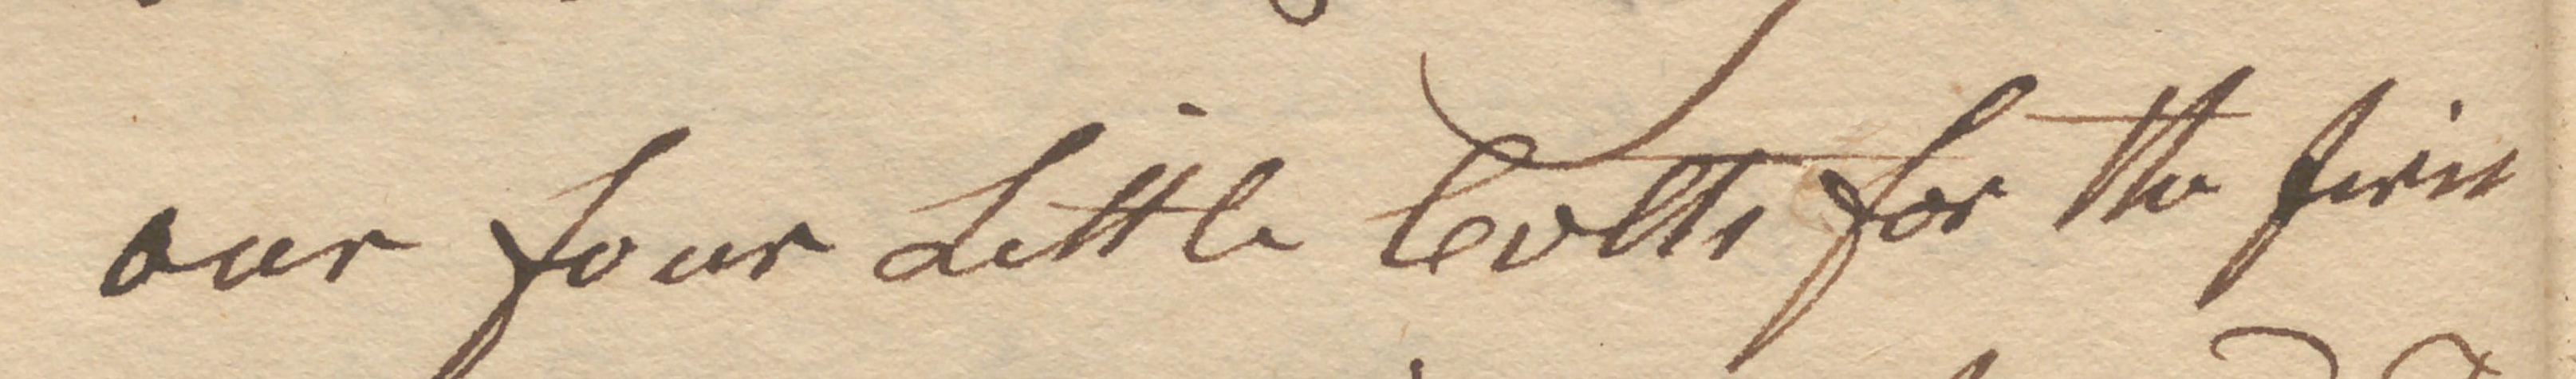our four Little Colts for the first
